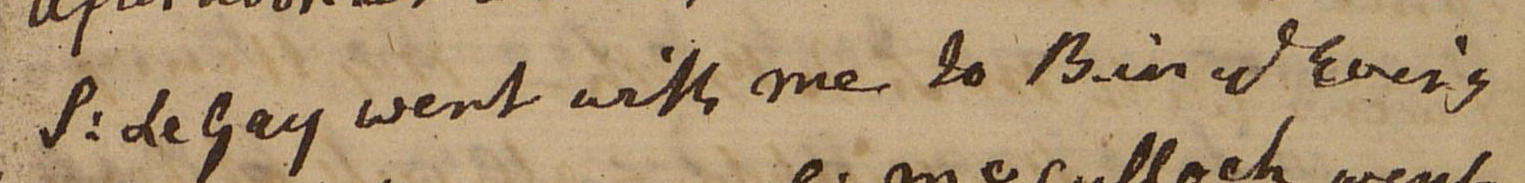S: LeGay went with me to Bin y^e Even'g
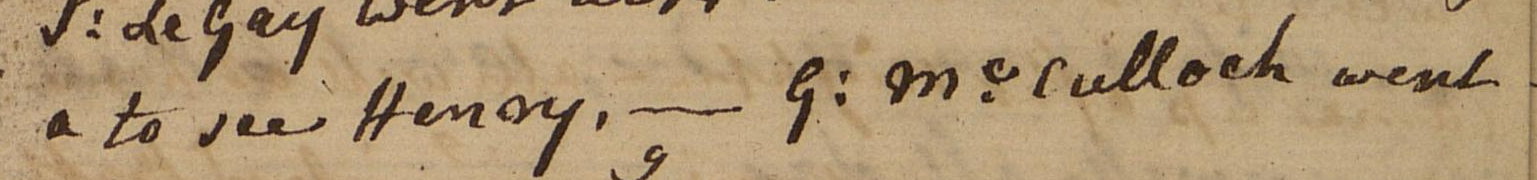a to see Henry,- G: M^c Culloch went
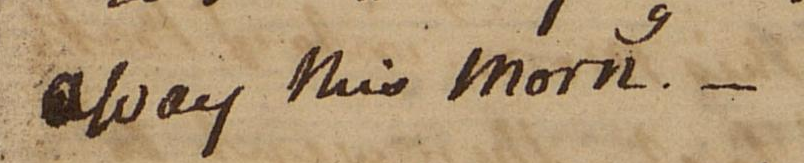away this Morn^g.--
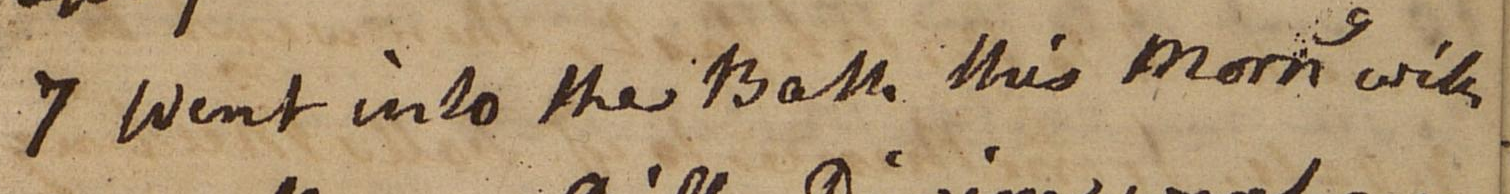7 went into the Bath this Morn^g. with
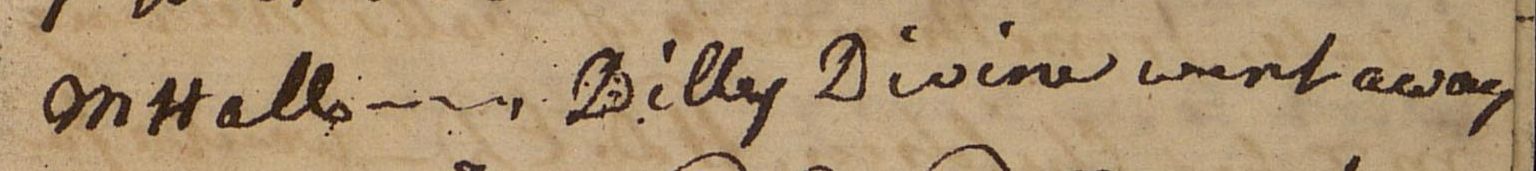M Halls - - Billy Divine went away
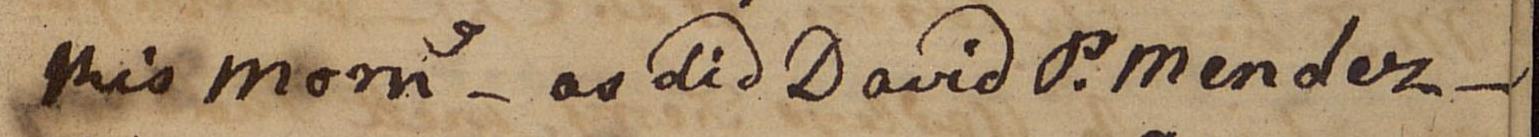this morn^g- as did David P. Mendez-
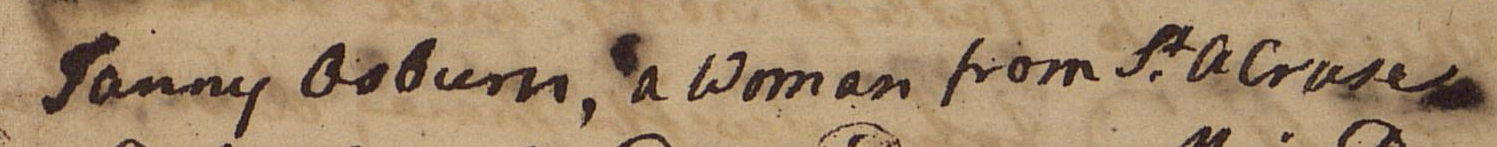Janny Osburn, a Woman from S^t. A Cruse
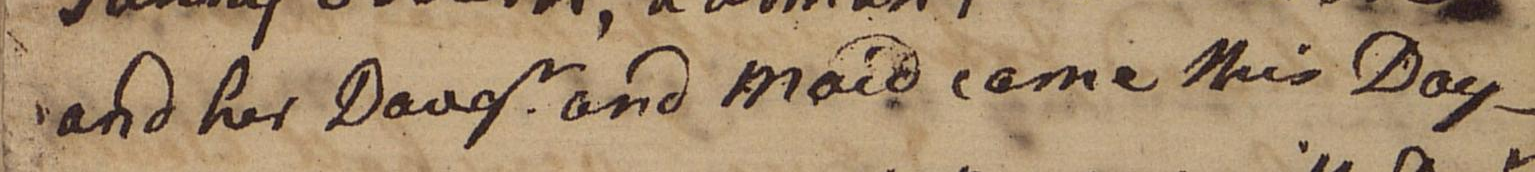and her Daug^r. and maid came this Day -
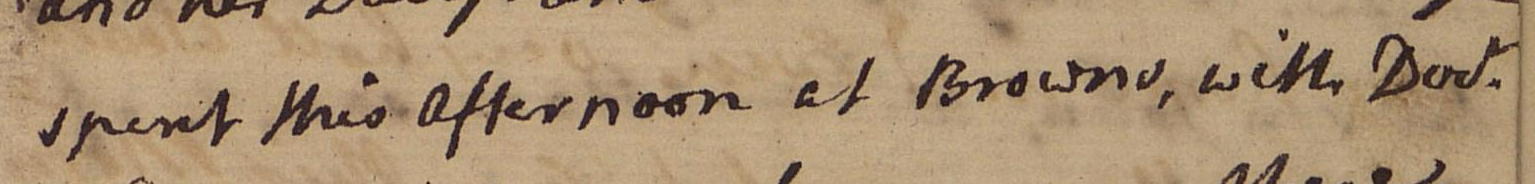spent this afternoon at Browns, with Doc^r.
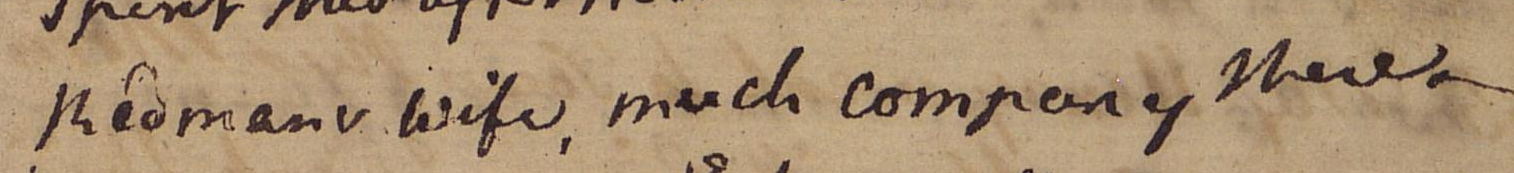Redmans wife, much company there,
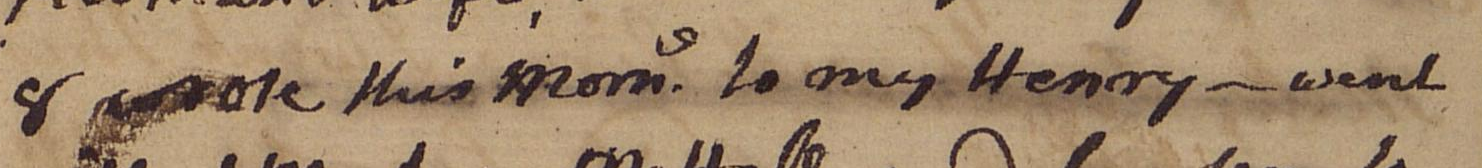8 wrote this Morn^g. to my Henry- went
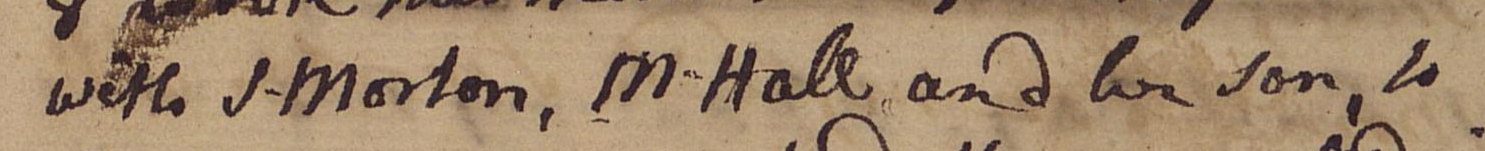with S. Morton, M Hall, and her son, to
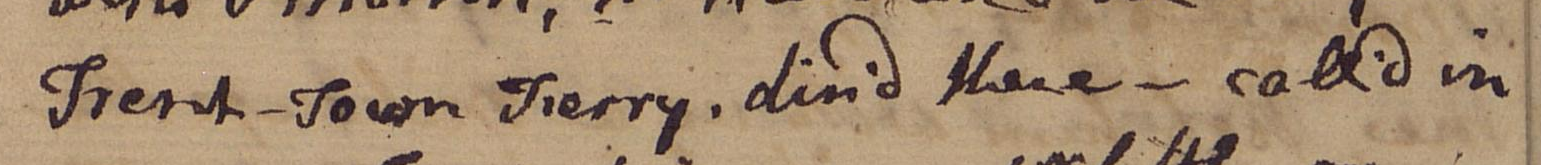Trent Town Ferry, din'd there- call'd in
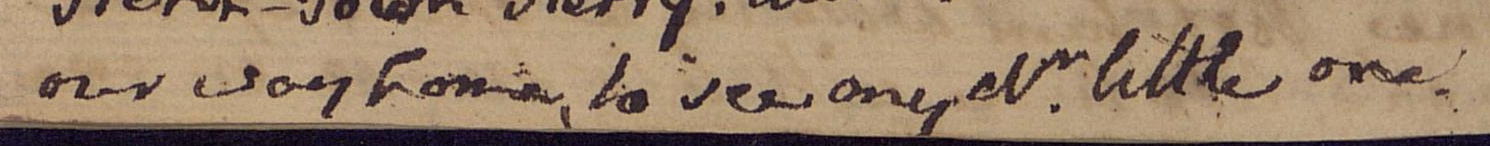our way home to see my d^r. little one.
